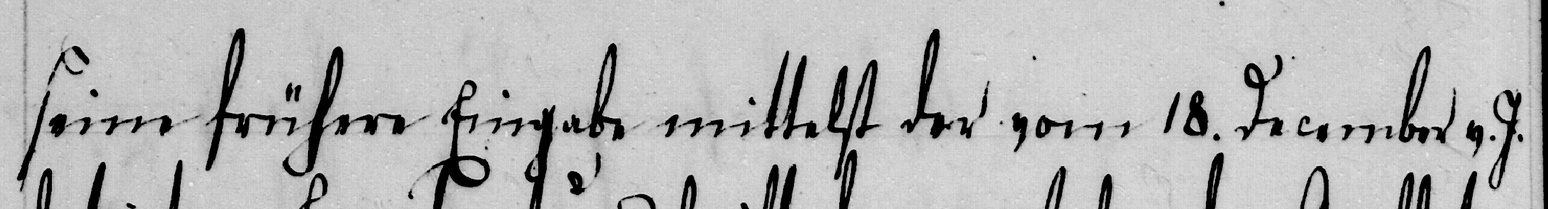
seine frühere Eingabe mittelst der vom 18. December v.
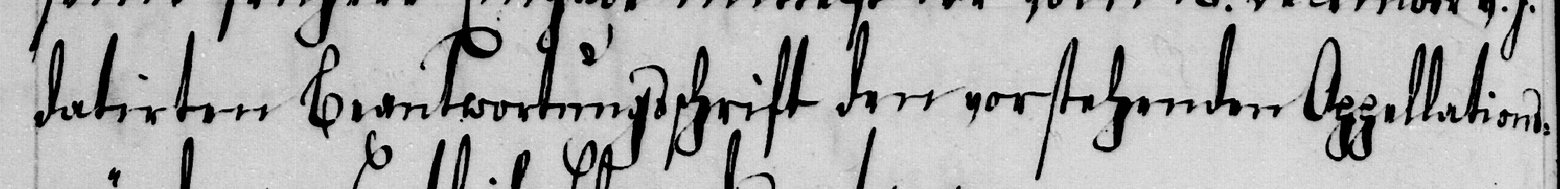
datirten Beantwortungsschrift den vorstehenden Appellati¬
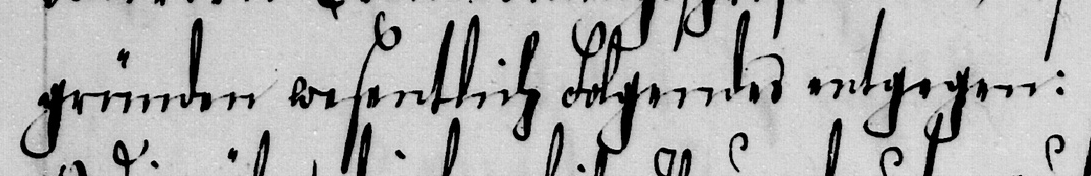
sgründen wesentlich Folgendes entgegnen:
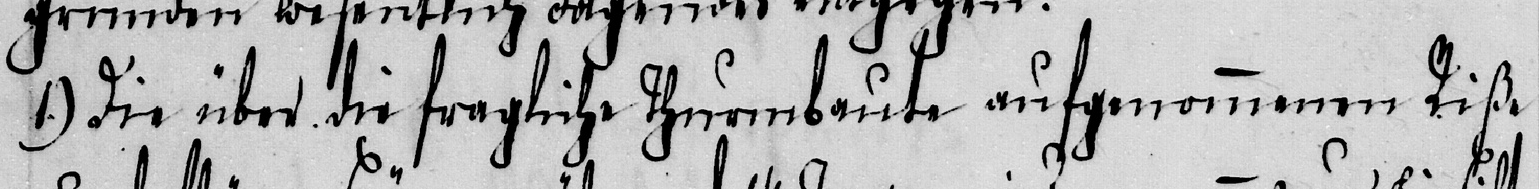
1.) Die über fragliche Thurmbaute aufgenommenen Riße
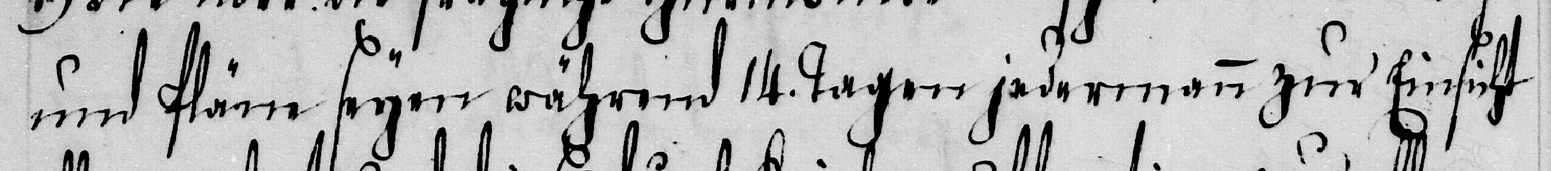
und Pläne seyen während 14. Tagen jedermann zur Einsicht
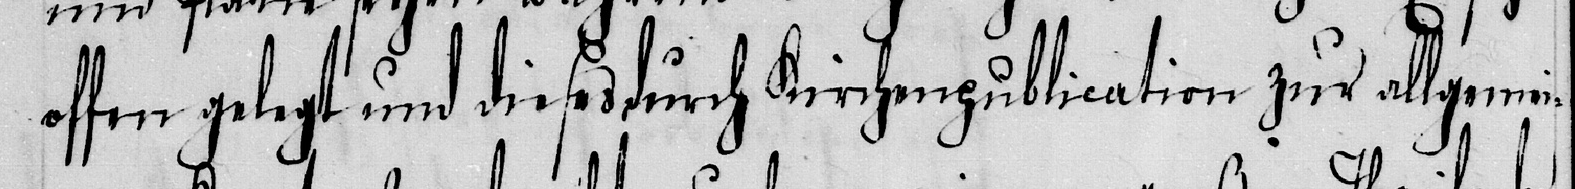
offen gelegt und dieses durch Kirchenpublication zur allgeme¬
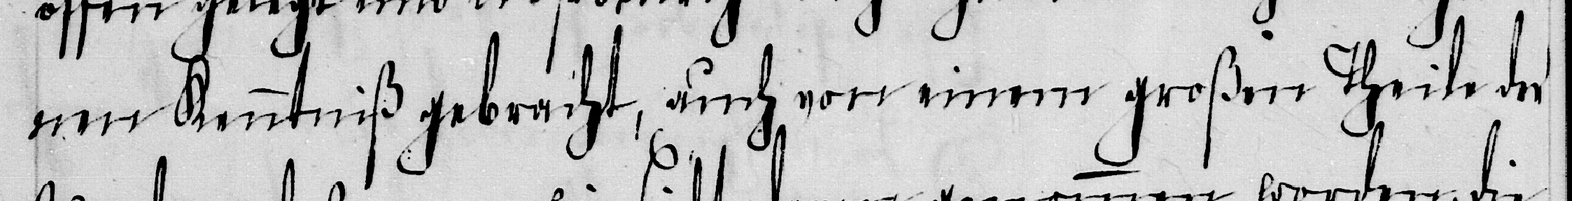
inen Kenntniß gebracht, auch von einem großen Theil der
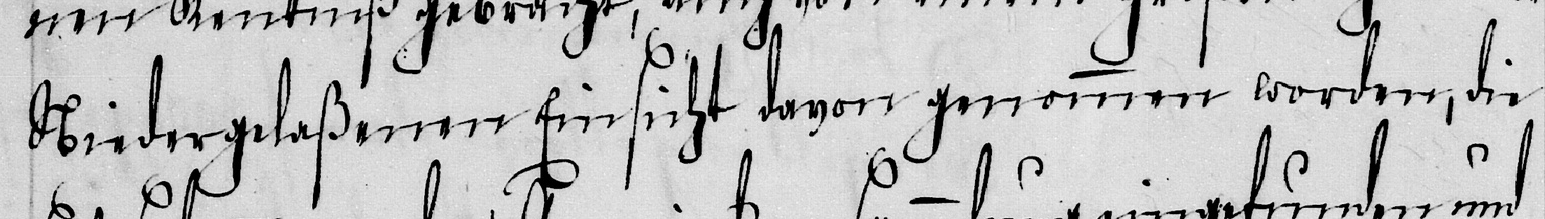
Niedergelaßenen Einsicht davon genommen worden, die
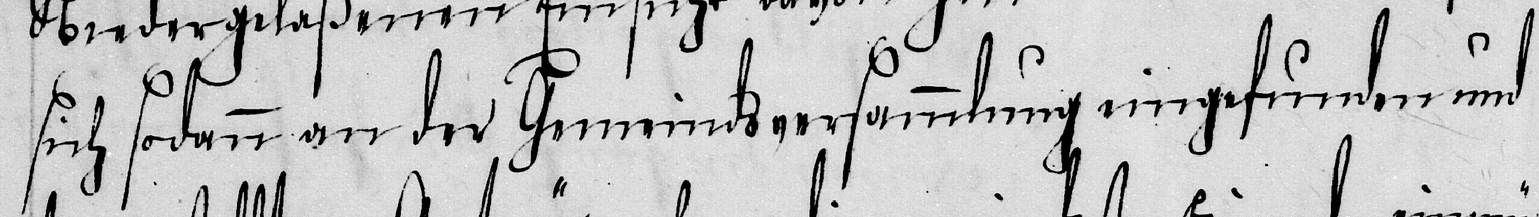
ich sodann an der Gemeindsversammlung eingefunden und
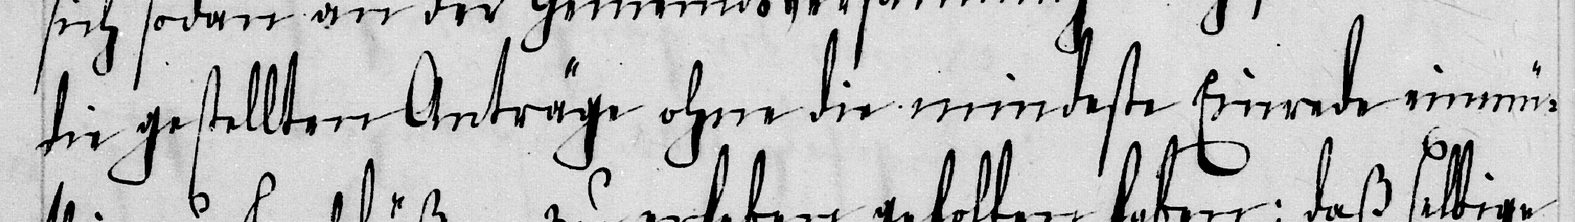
die gestellten Anträge ohne die mindeste Einrede einmü¬
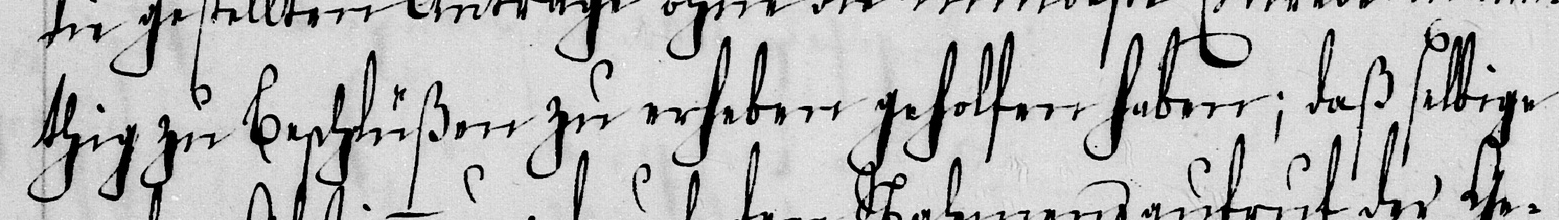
thig zu Beschlüßen zu erheben geholfen haben; daß selbige
